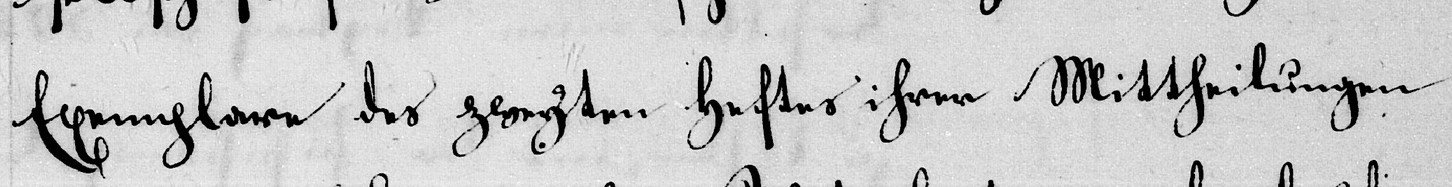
Exemplare des zweyten Heftes ihrer Mittheilungen
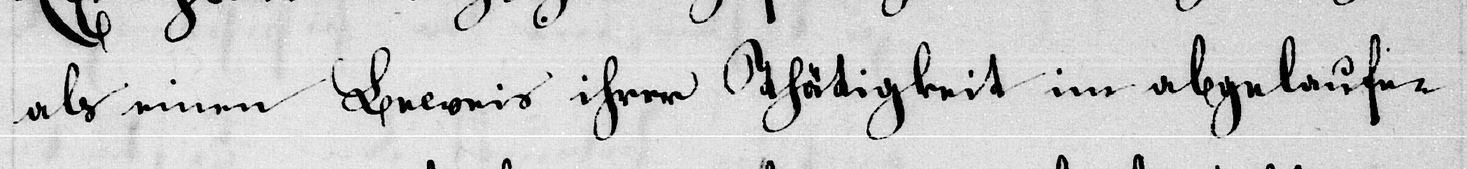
als einen Beweis ihrer Thätigkeit im abgelaufe¬
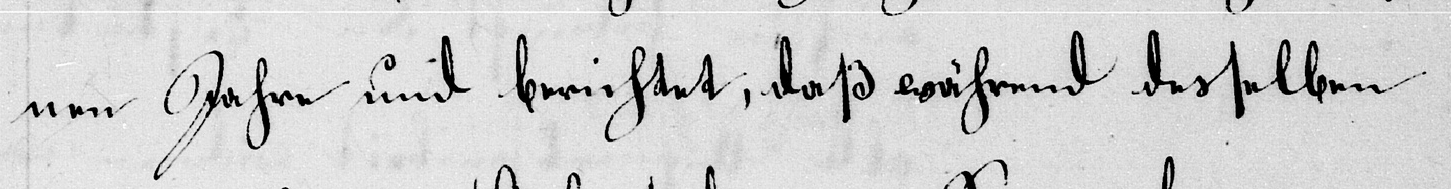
nen Jahre und berichtet, daß während desselben
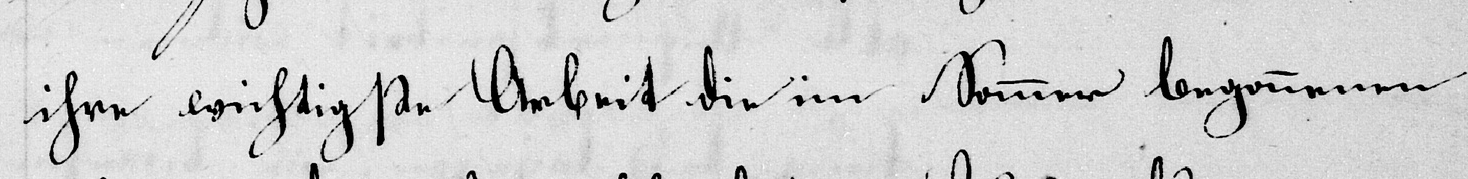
ihre wichtigste Arbeit die im Sommer begonnene
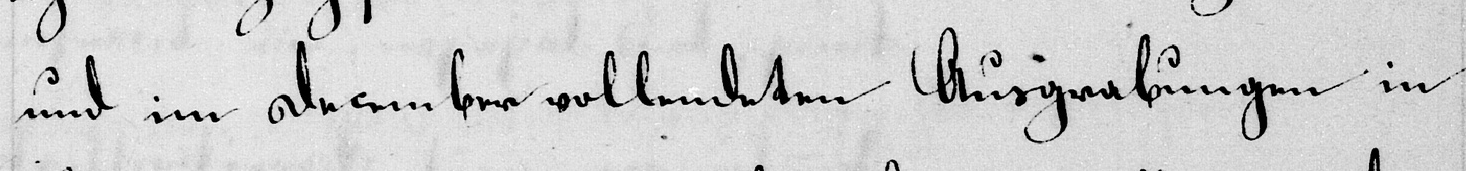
und im December vollendeten Ausgrabungen in
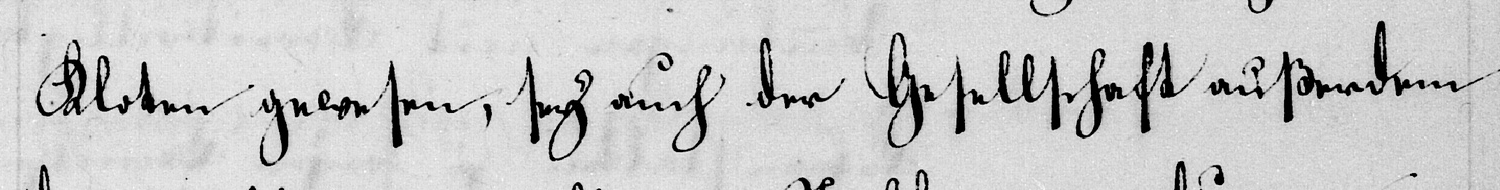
Kloten gewesen, sey auch der Gesellschaft außerdem
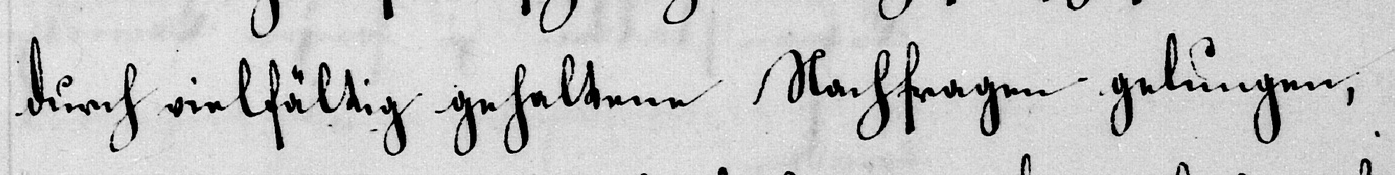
durch vielfältig gehaltene Nachfragen gelungen,
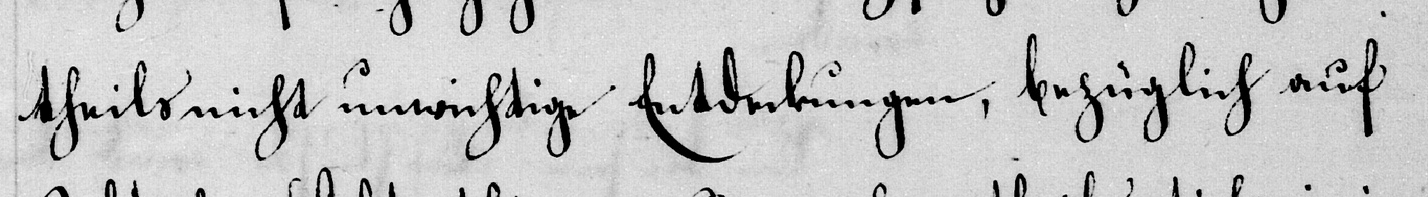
theils nicht unwichtige Entdeckungen, bezüglich auf
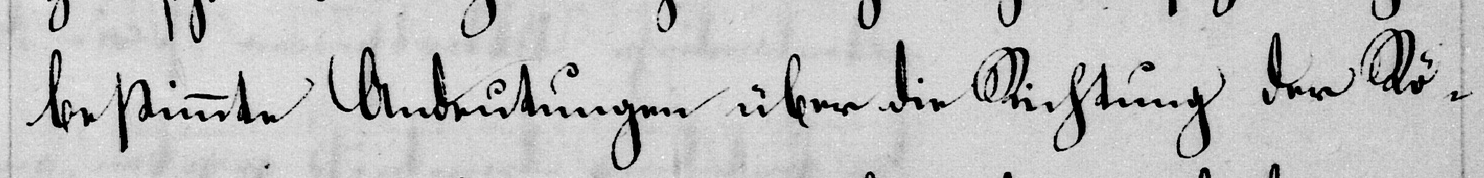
bestimmte Andeutungen über die Richtung der Rö¬
